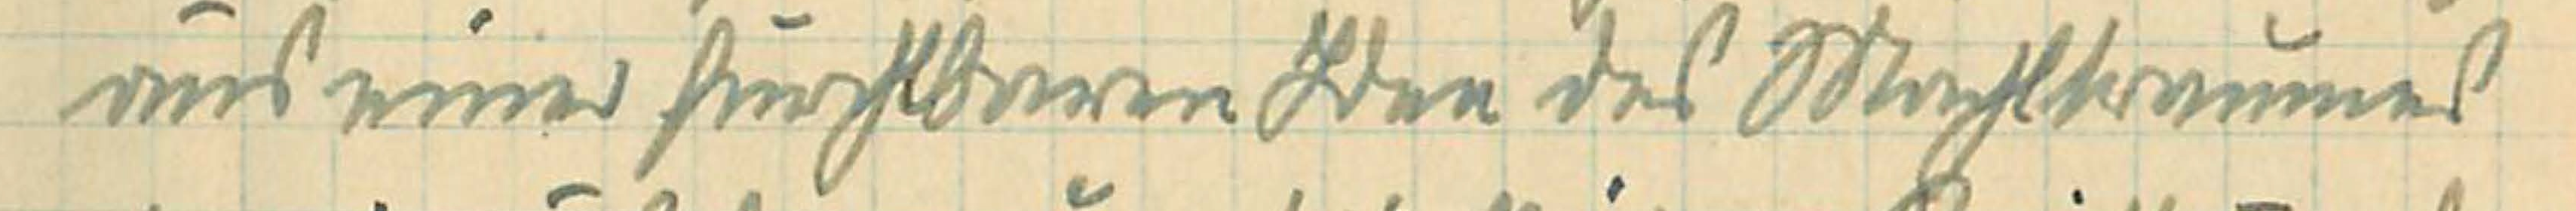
aus einer furchtbaren Idee des Machttraumes
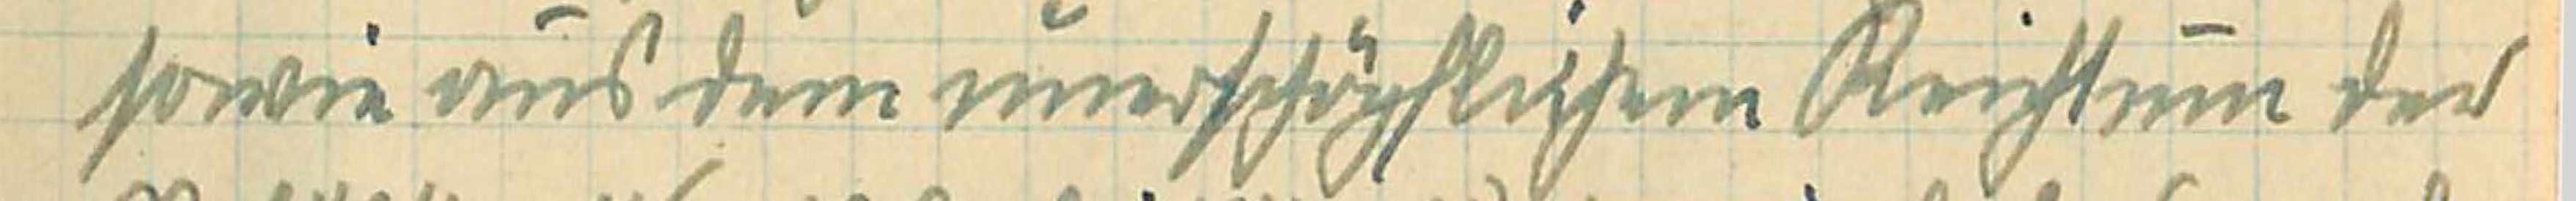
sowie aus dem unerschöpflichen Reichtum der
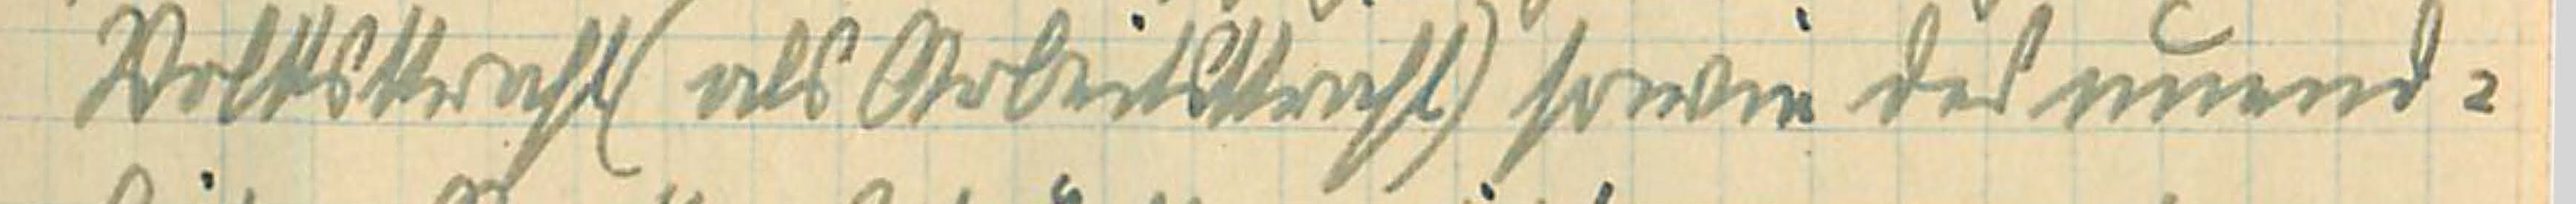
Volkskraft (als Arbeitskraft) sowie des unend-
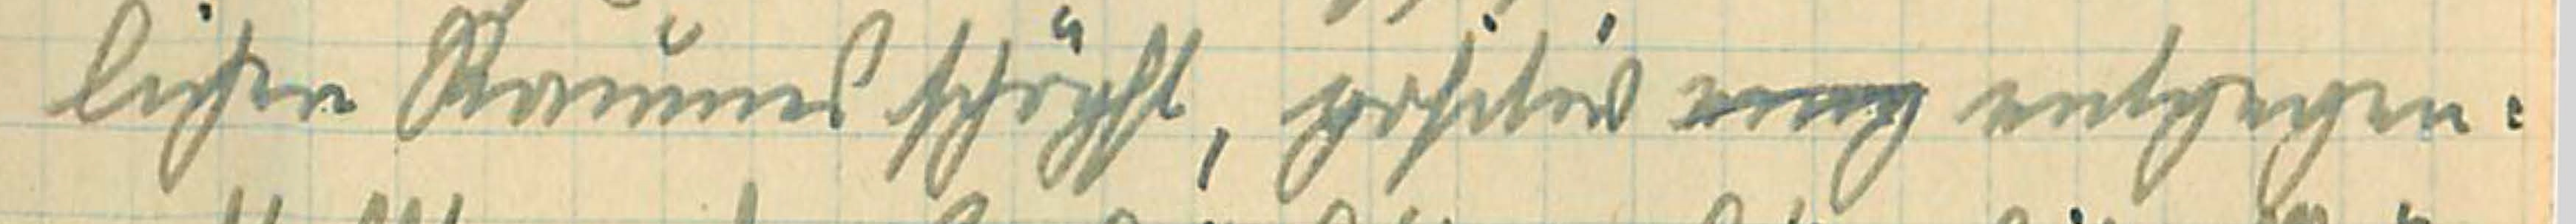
lichen Raumes schöpft, positiv eng entgegen-
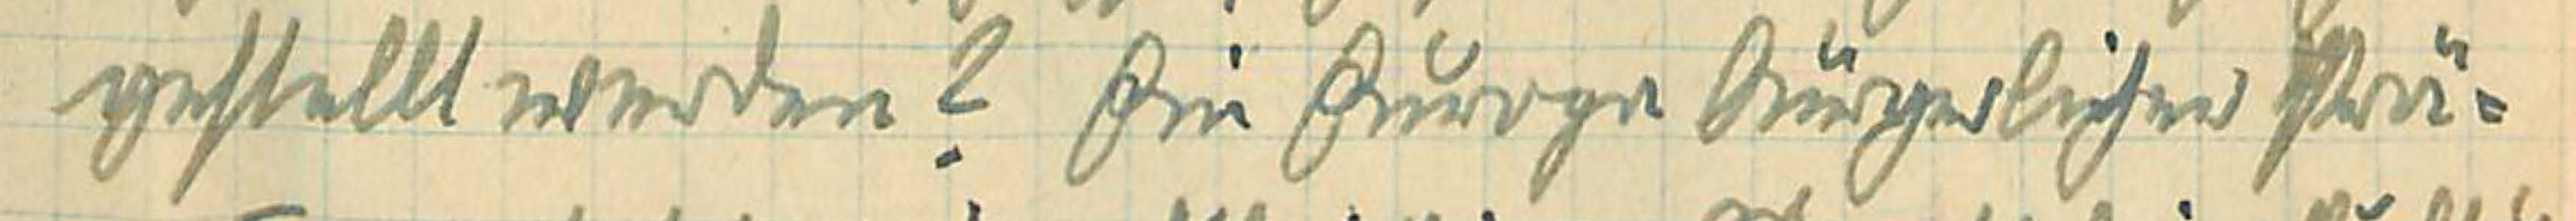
gestellt werden? Ein Europa bürgerlicher Prä-
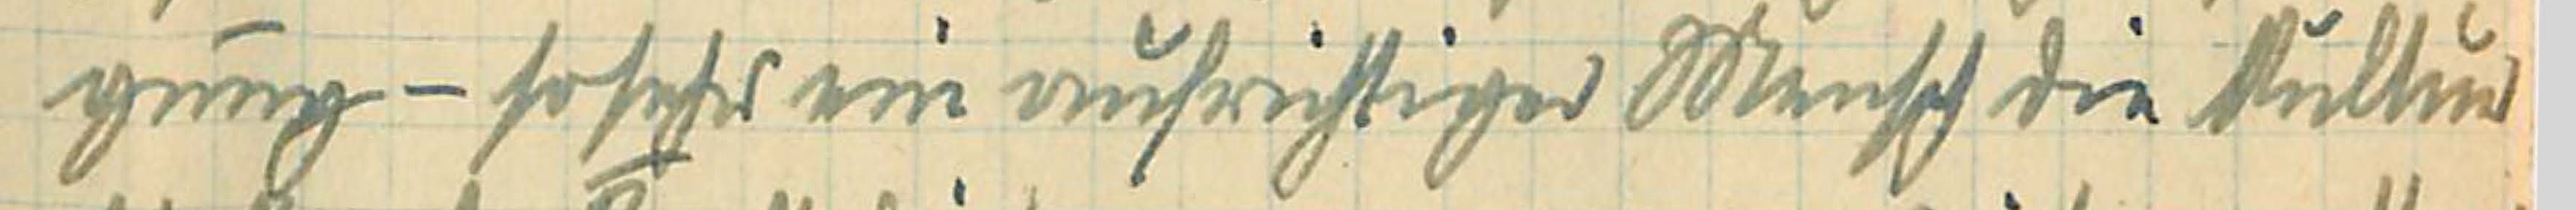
gung – sosehr ein aufrichtiger Mensch die kultur-
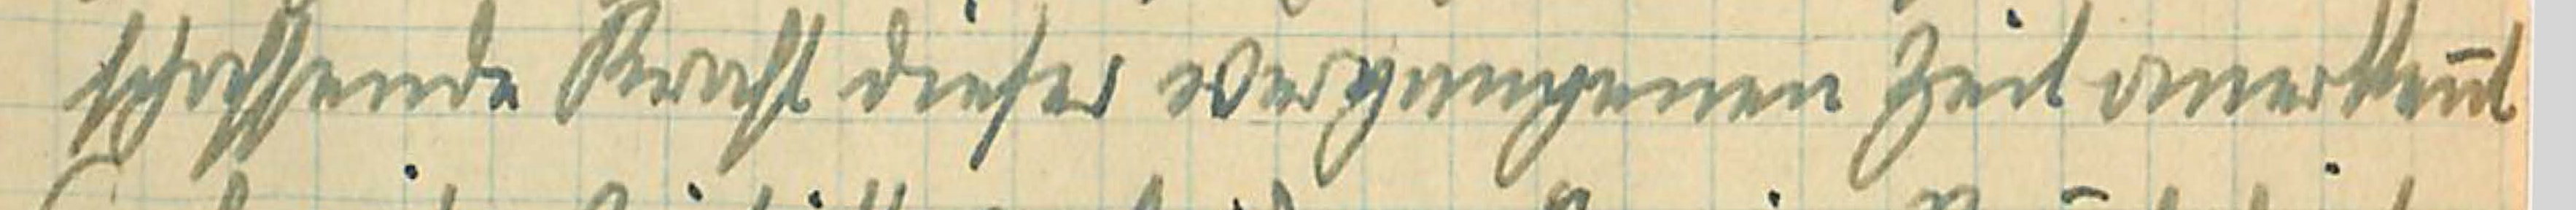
schaffende Kraft dieser vergangenen Zeit anerkennt
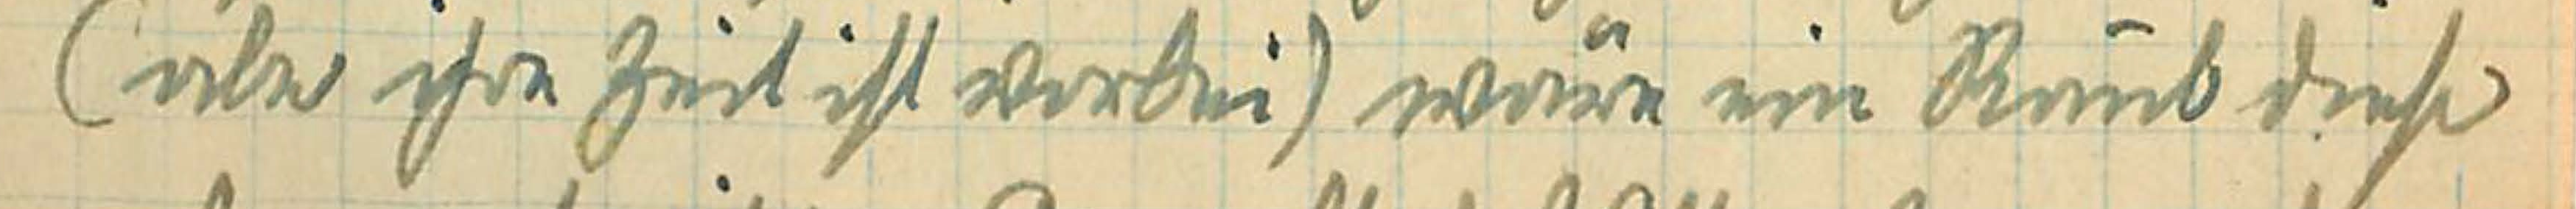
(aber ihre Zeit ist vorbei) wäre ein Raub dieser
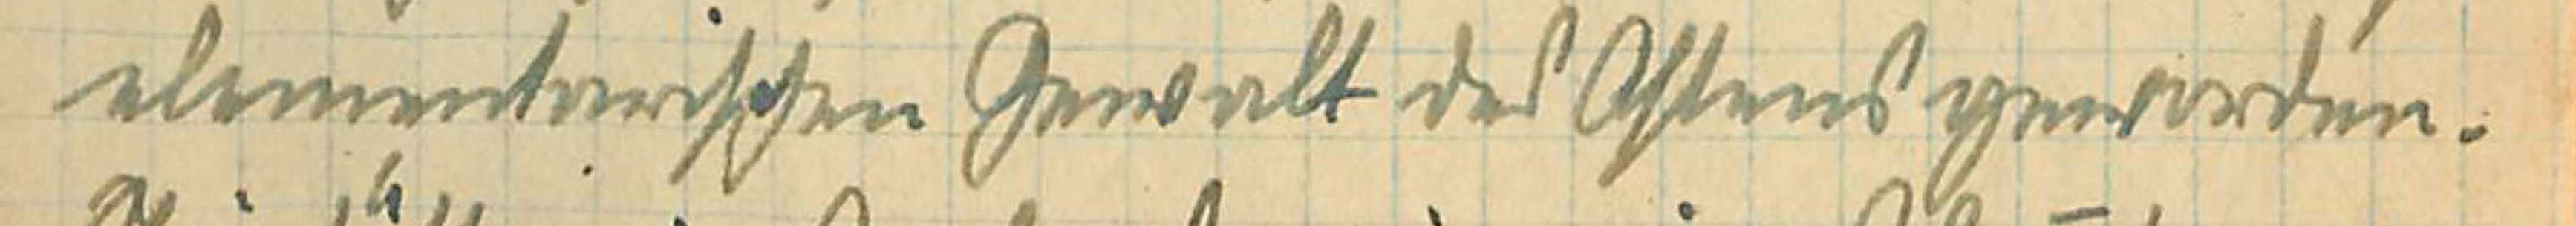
elementarischen Gewalt des Ostens geworden.
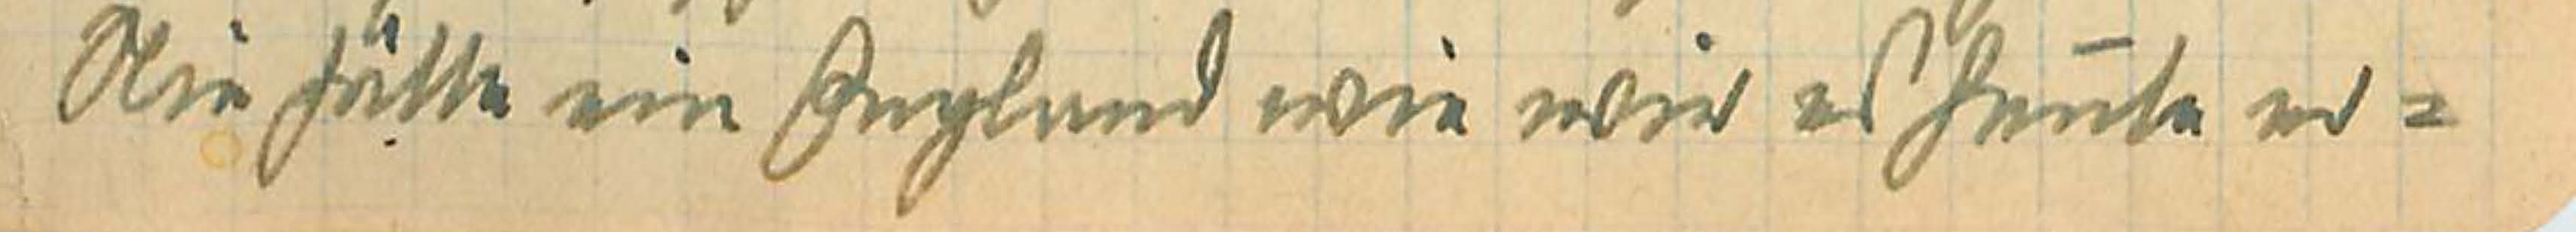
Nie hätte ein England wie wir es heute er-
